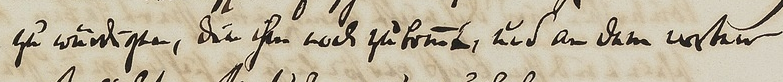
zu würdigen, die ihm noch zukommt, und an dem ersten
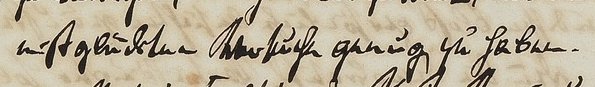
mißglückten Versuche genug zu haben.
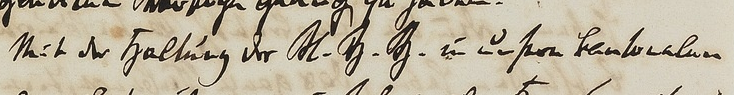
Mit der Haltung der N.Z.Z. in unsern kantonalen
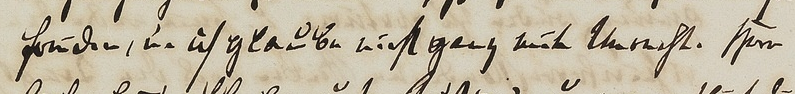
frieden, u. ich glauben nicht ganz mit Unrecht. Herr
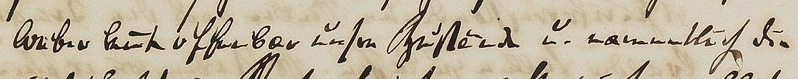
Weber kennt offenbar unre Zustände u. namentlich die
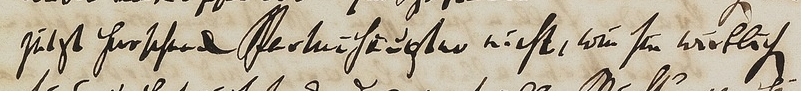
jetzt herrschenden Parteihäupter nicht, wie sie wirklich
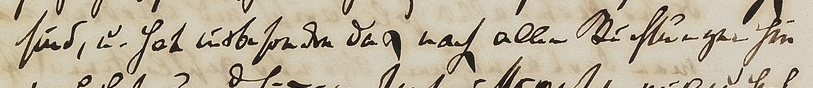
sind, u. hat insbesondre das nach allen Richtungen hin
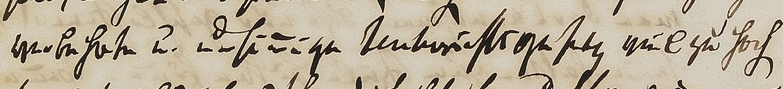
verkehrte u. unsinnige Unterrichtsgesetz viel zu hoch
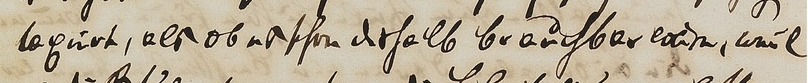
taxiert, als ob es schon deshalb brauchbar wäre, weil
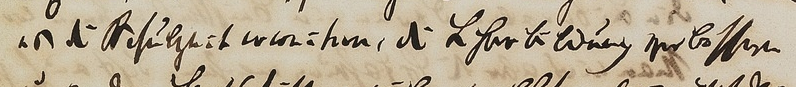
es die Schulzeit erweitern, die Lehrerbildung verbessern
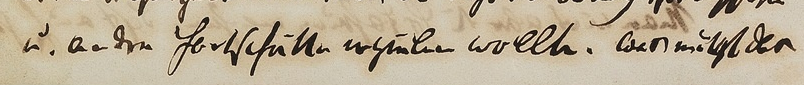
u. andre Fortschritte erzielen wollte. Was nutzt das
